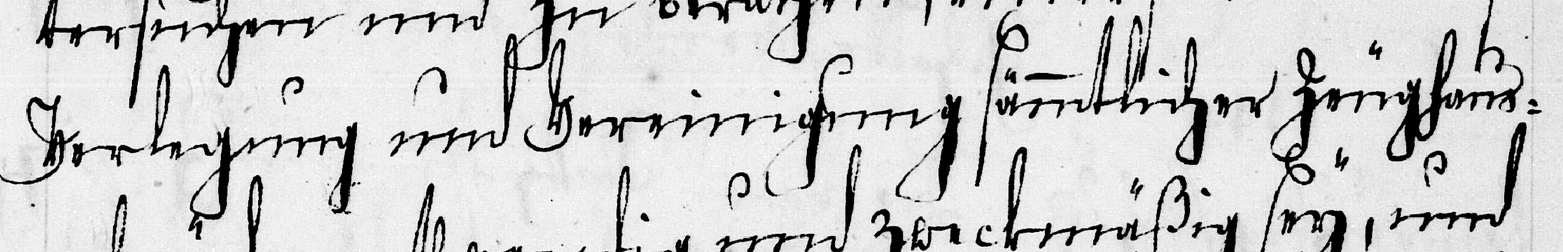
Verlegung und Vereinigung sämmtlicher Zeughaus¬
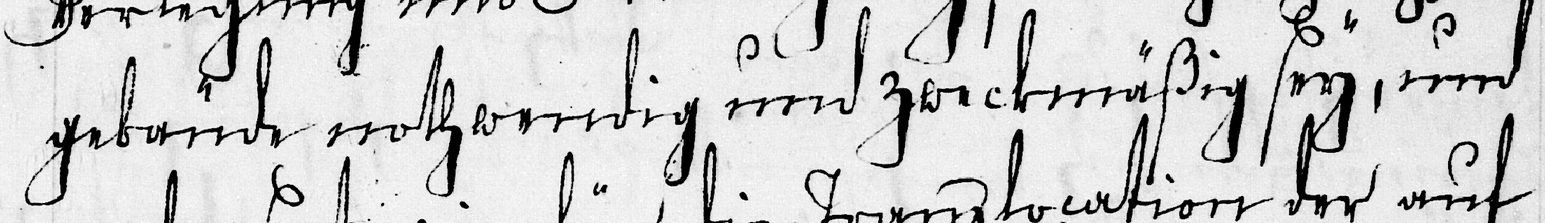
gebäude nothwendig und zweckmäßig sey, und
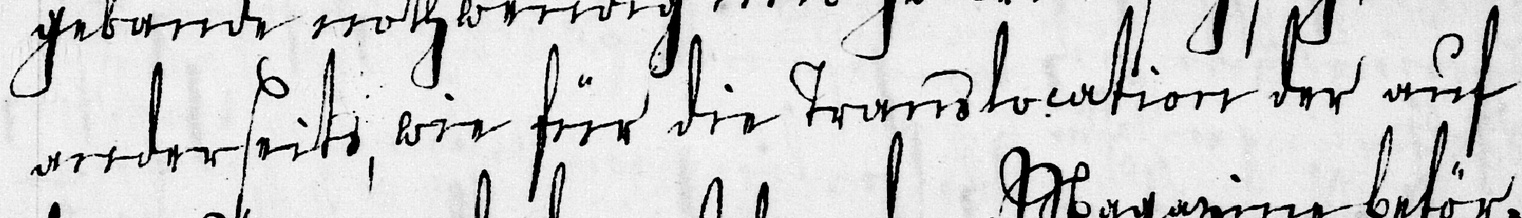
anderseits, wie für die Translocation der auf
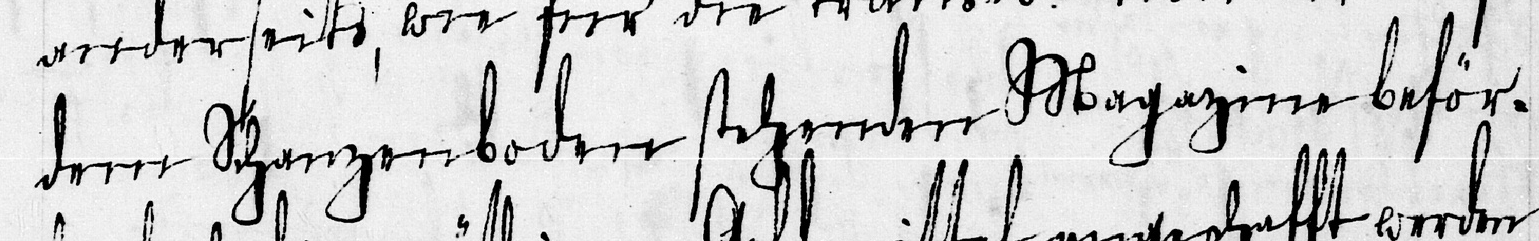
dem Schanzenboden stehenden Magazine beför¬
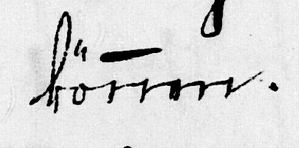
können.
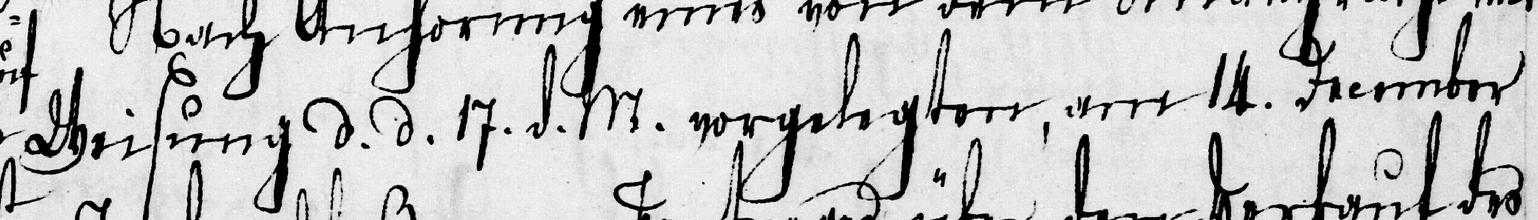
Weisung d. d. 17. d. M. vorgelegten, am 14. December
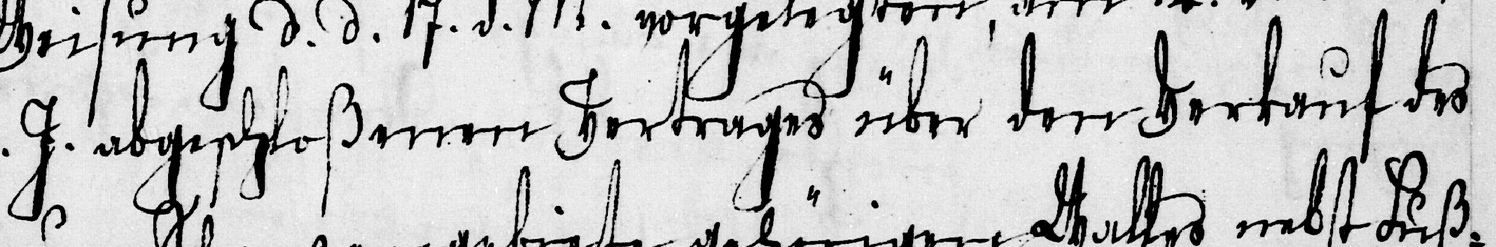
J. abgeschloßenen Vertrages über den Verkauf des
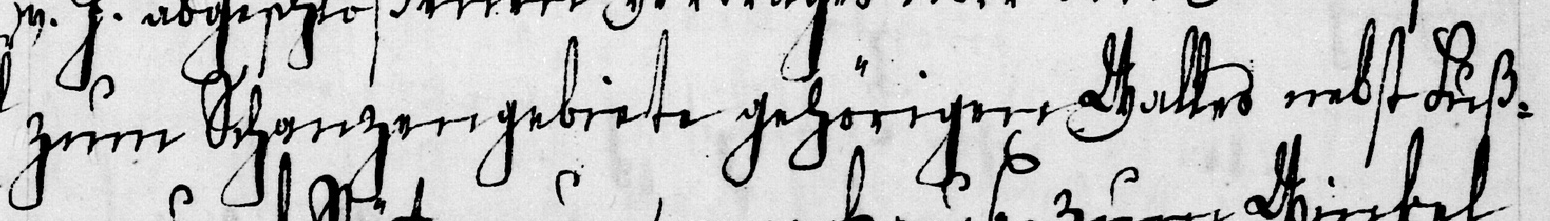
zum Schanzengebiete gehörigen Walles nebst Fuß¬
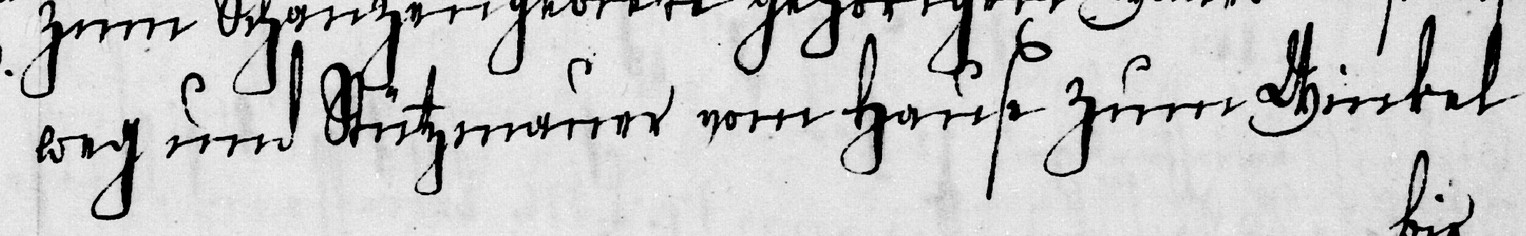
weg und Stützmauer vom Hause zum Winkel
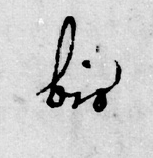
den
